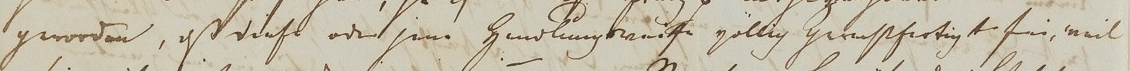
geworden, dß diese oder jene Handlungsweise völlig gerechtfertigt sei, weil
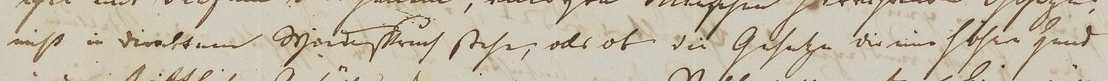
nicht in direktem Wiederspruch stehe, als ob die Gesetze die eine höhere Hand
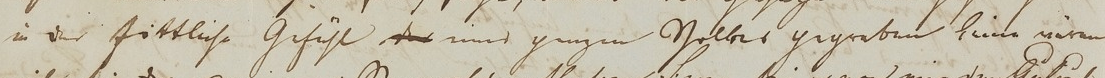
in das sittliche Gefühl des eines ganzen Volkes gegraben keine wären
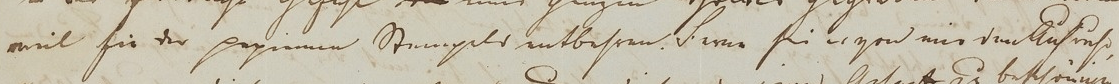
weil sie des papiernen Stempels entbehren. Ferne sei es von mir den Aufruhr,
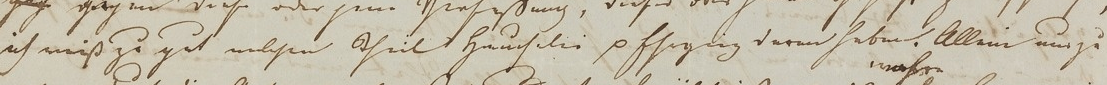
ich weiß zu gut welchen Theil Heuchelei & Ehrgeiz daran haben. Allein nur zu
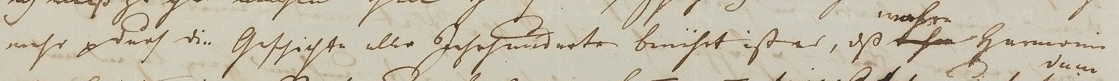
wahr & durch die Geschichte aller Jahrhunderte bewährt ist es, daß ... wahre Harmonie
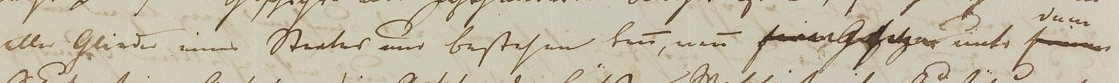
aller Glieder eines Staates nur bestehen kann, wenn seine Gesetze unter seinendem
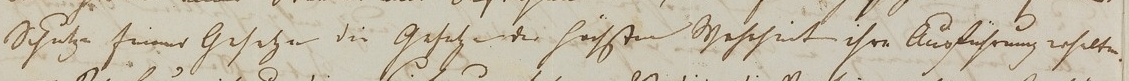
Schutze seiner Gesetze die Gesetze der höchsten Wahrheit ihre Ausführung erhalten.
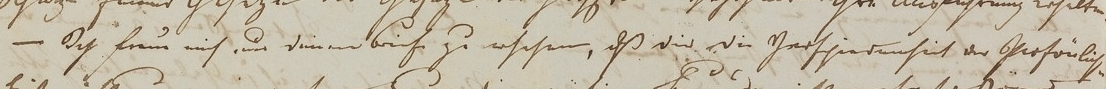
­ Ich freue mich aus deinem Briefe zu ersehen, dß dir die Verschiedenheit der Persönlich-
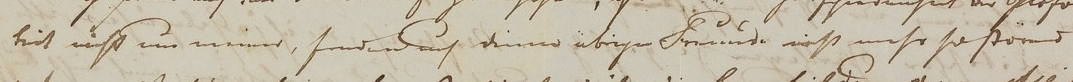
keit nicht nur meiner, sondern auch deiner übrigen Freunde nicht mehr so störend
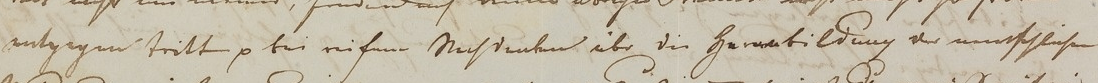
entgegen tritt & bei reifem Nachdenken über die Heranbildung der menschlichen
